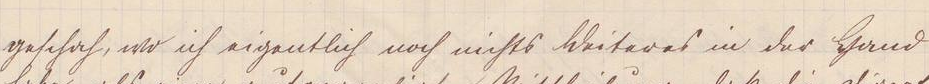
geschah, wo ich eigentlich noch nichts Weiteres in der Hand
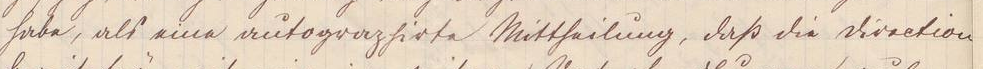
habe, als eine autographirte Mittheilung, daß die Direction
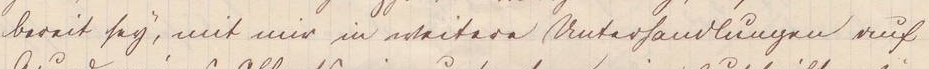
bereit sey, mit mir in weitere Unterhandlungen auf
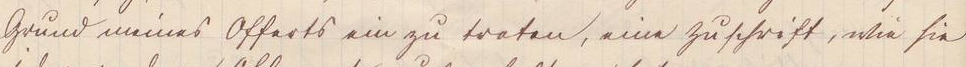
Grund meines Offerts ein zu treten, eine Zuschrift, wie sie
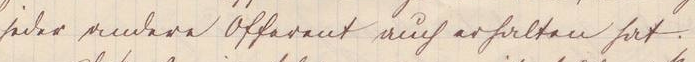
jeder andere Offerent auch erhalten hat.
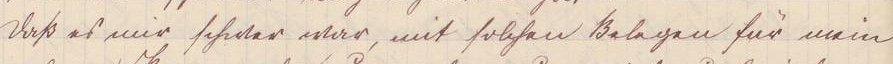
Daß es mir schwer war, mit solchen Belegen für mein
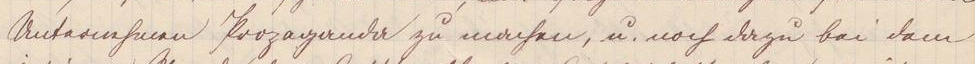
Unternehmen Propaganda zu machen, u. noch dazu bei dem
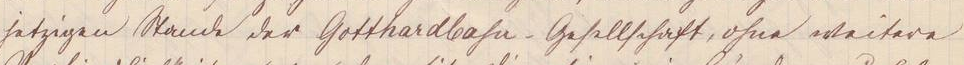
jetzigen Stande der Gotthardbahn-Gesellschaft, ohne weitere
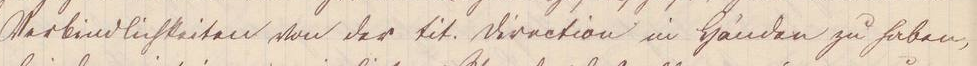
Verbindlichkeiten von der tit. Direction in Händen zu haben
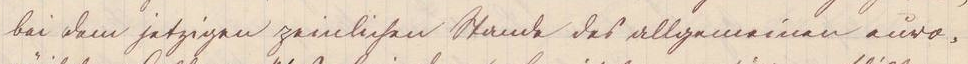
bei dem jetzigen peinlichen Stande des allgemeinen euro-
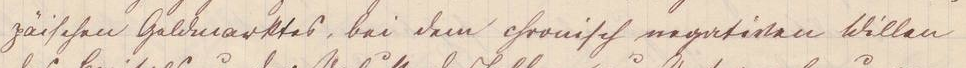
päischen Geldmarktes, bei dem chronisch negativen Willen
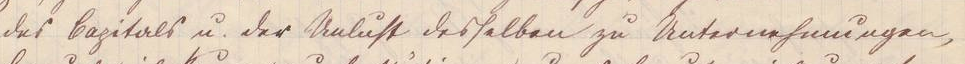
des Capitals u. der Unlust desselben zu Unternehmungen,
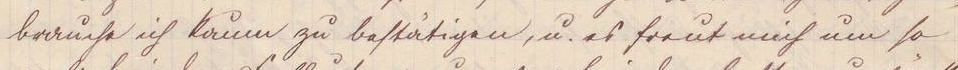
brauche ich kaum zu bestätigen, u. es freut mich um so
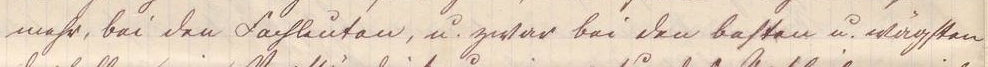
mehr, bei den Fachleuten, u. zwar bei den besten u. wägsten
